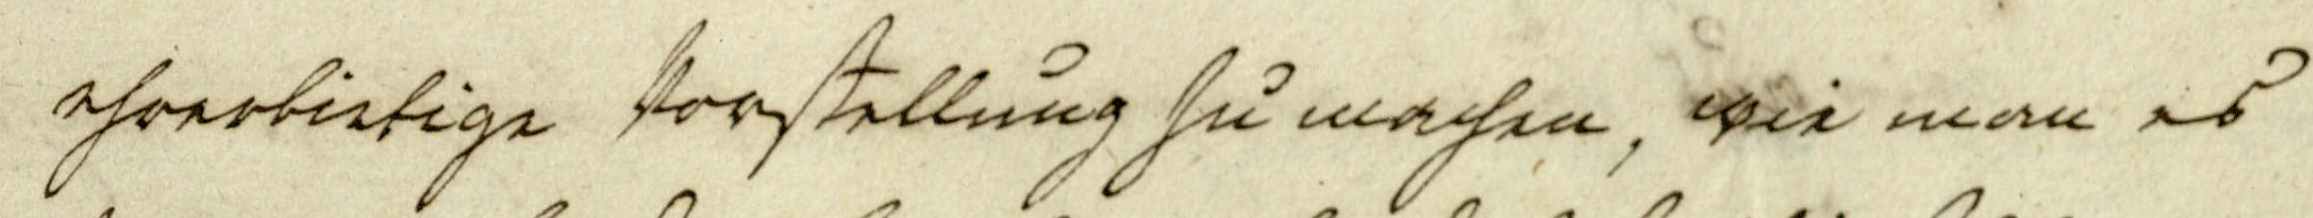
ehrerbietige Vorstellung zu machen, wie man es
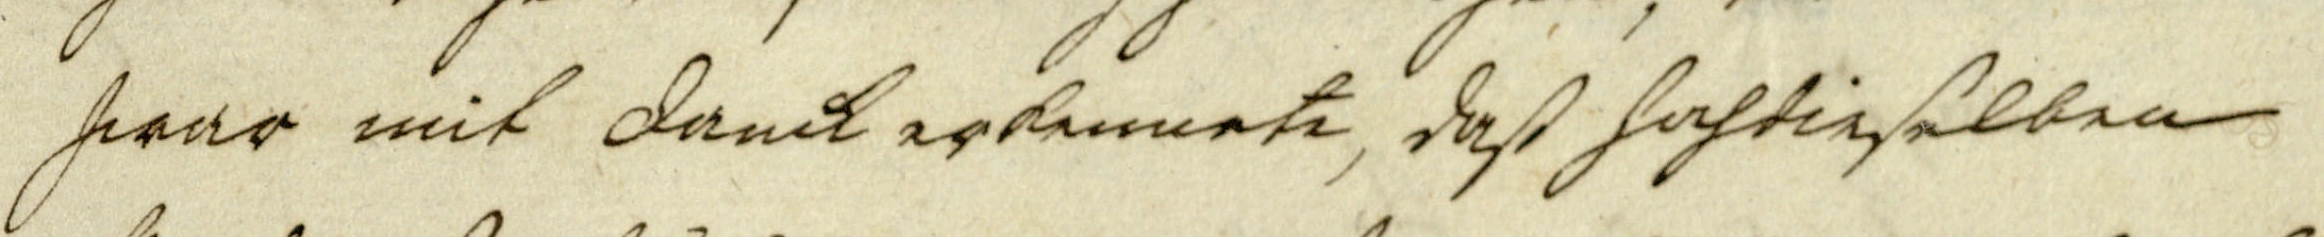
zwar mit Danck erkennete, daß hochdieselben
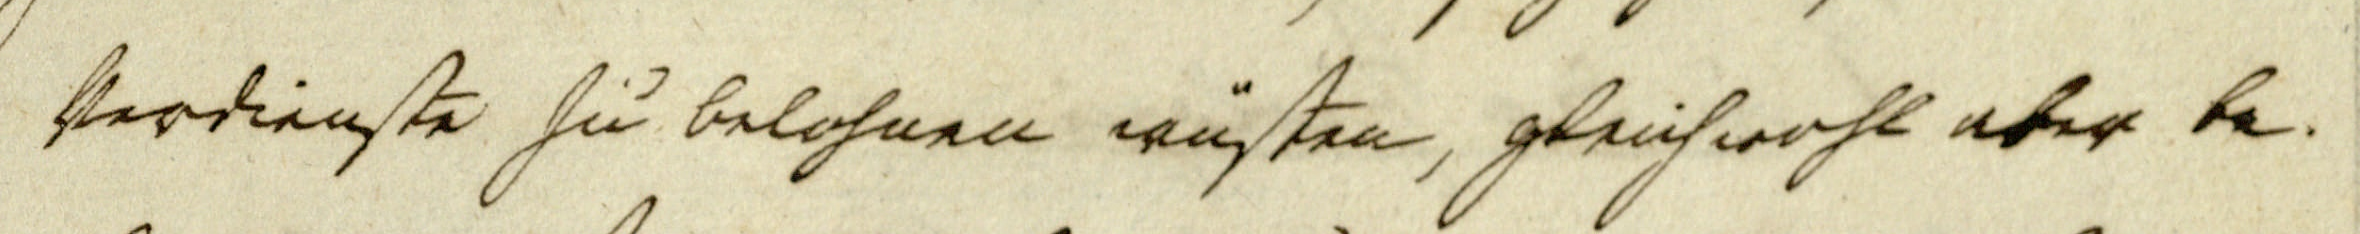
Verdienste zu belohnen wüsten, gleichwohl aber be¬
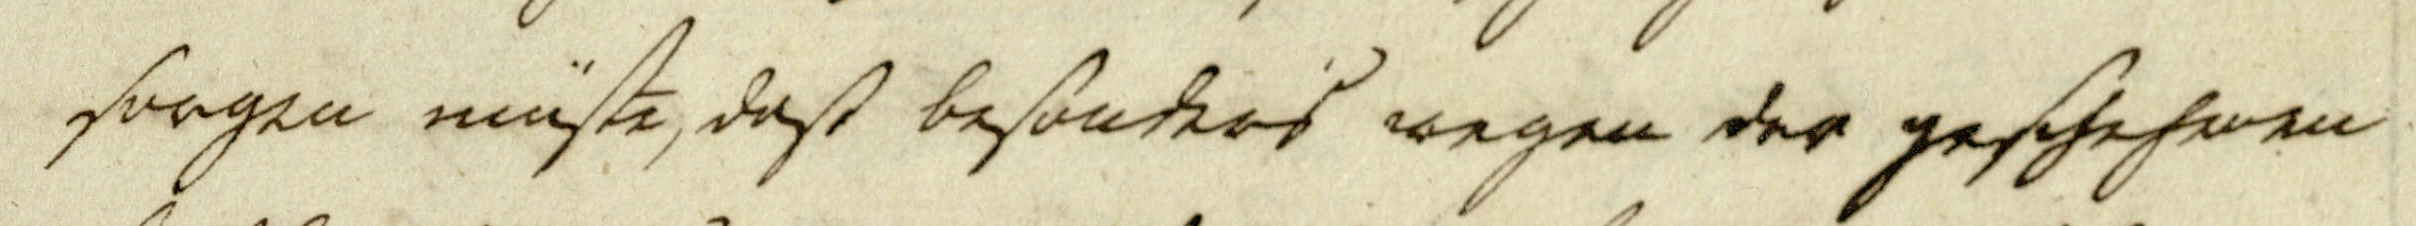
sorgen müste, daß besonders wegen der geschehenen
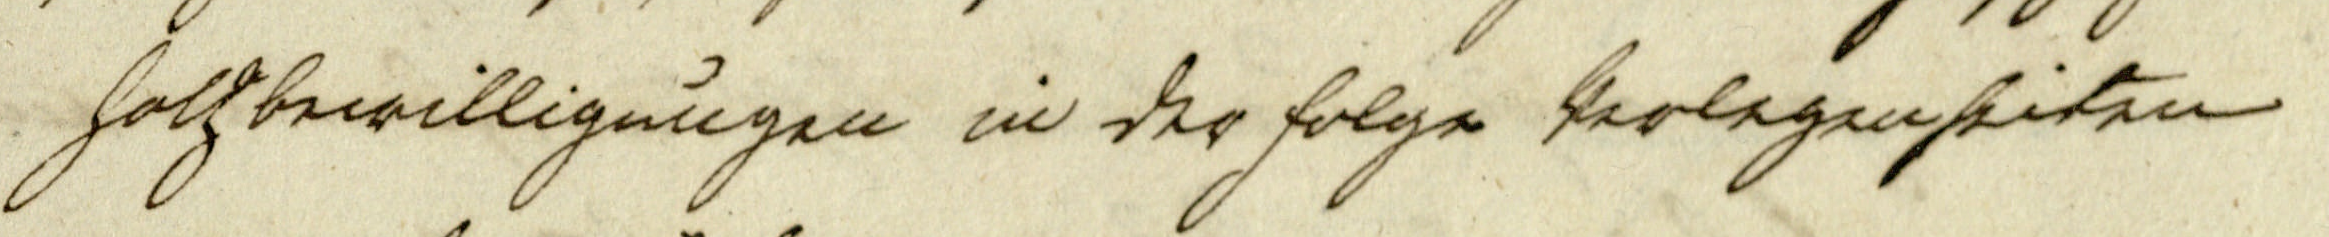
holzbewilligungen in der Folge Verlegenheiten
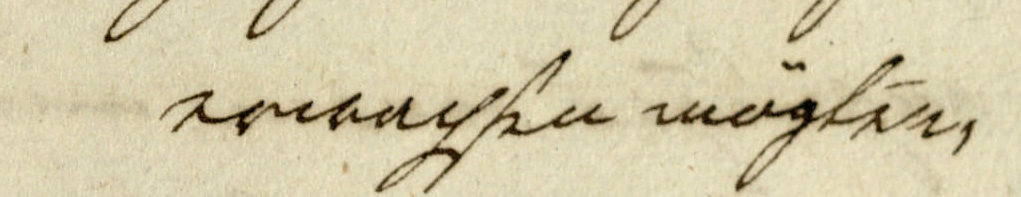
erwachsen mögten,
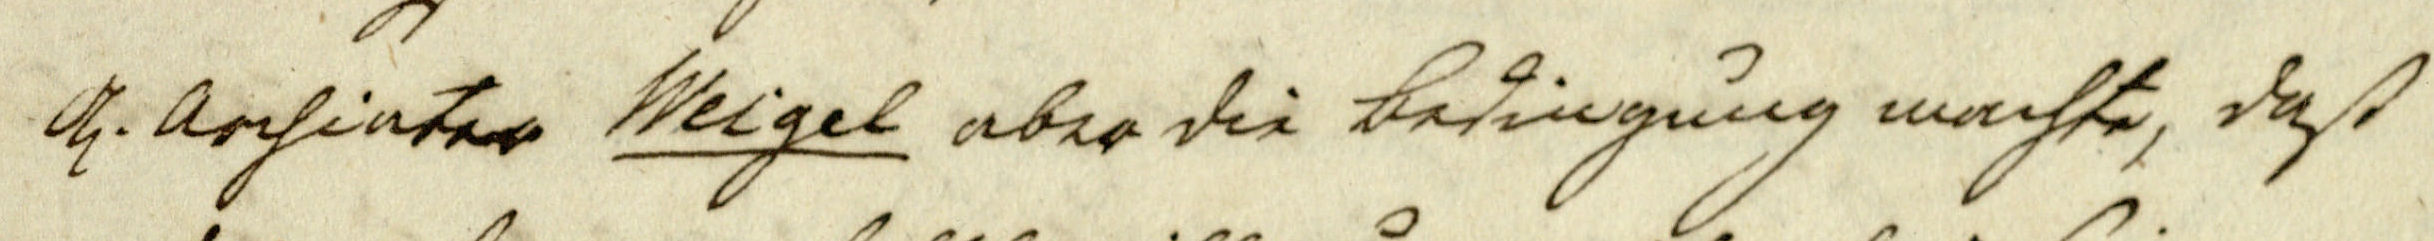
dh. Archiater Weigel aber die Bedingung machte, daß
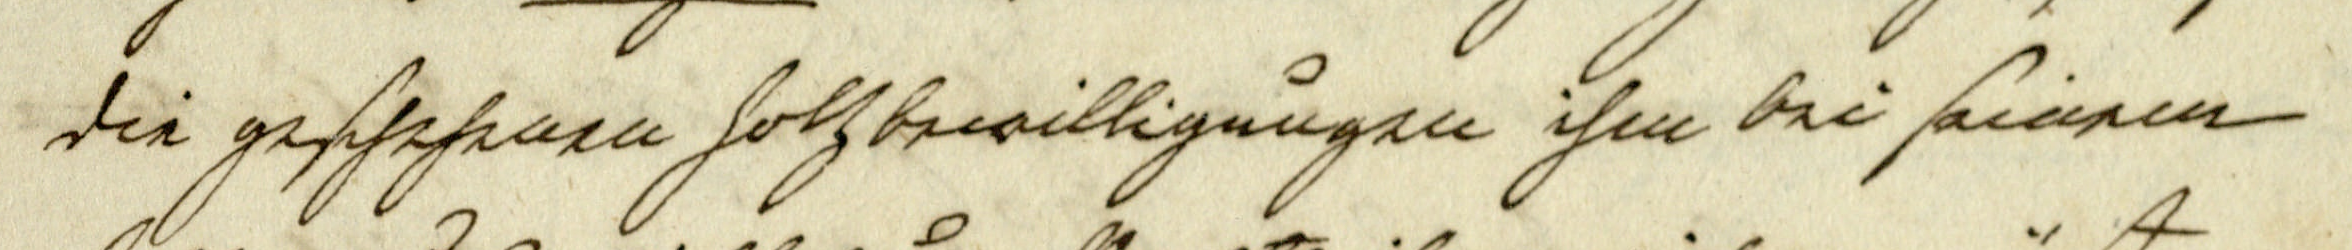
die geschehenen holzbewilligungen ihm bei seinem
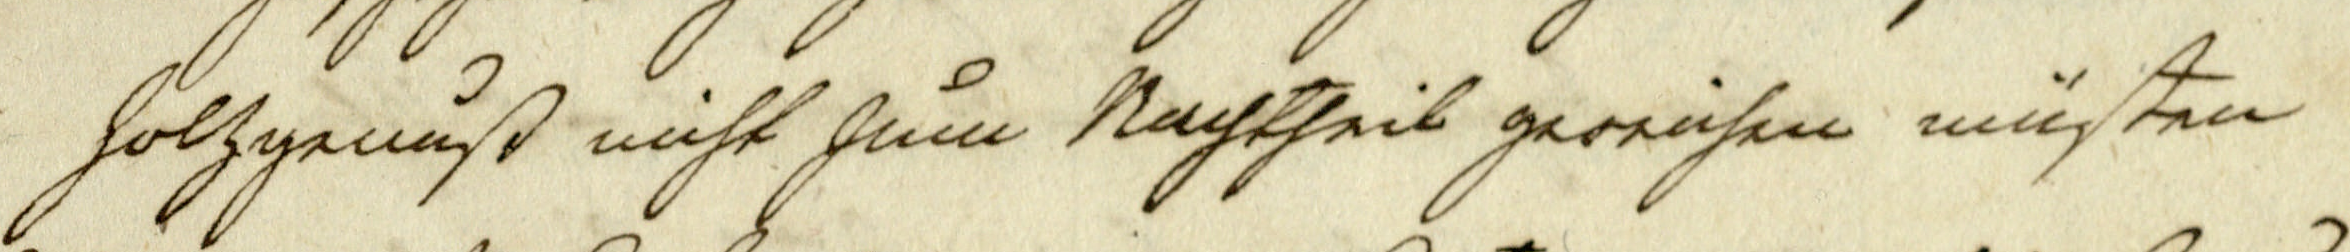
holzgenuß nicht zum Nachtheil gereichen müsten
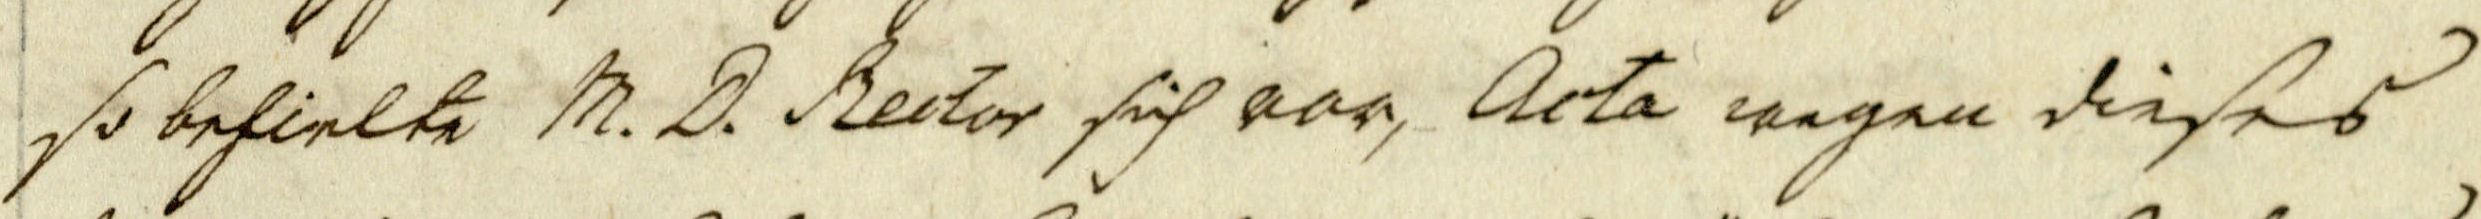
so behielte M. D. Rector sich vor, Acta wegen dieses
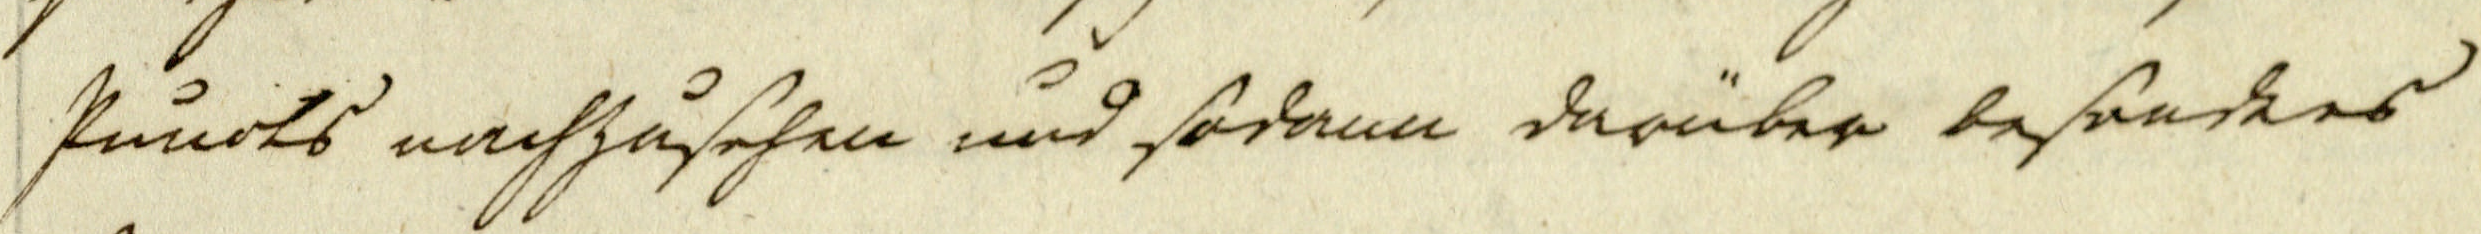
Puncts nachzusehen und sodann darüber besonders
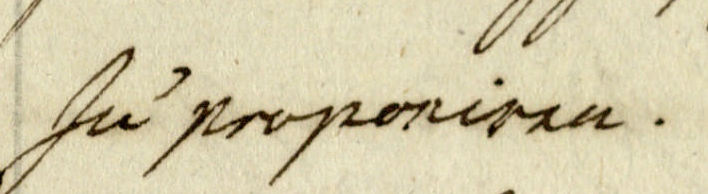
zu proponiren.
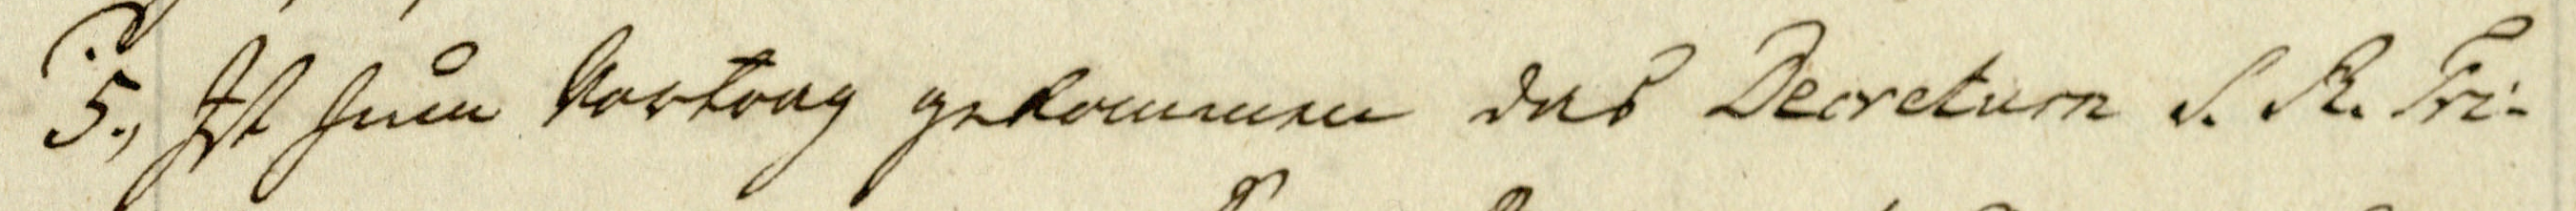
5., Ist zum Vortrag gekommen das Decretum S. R. Tri¬
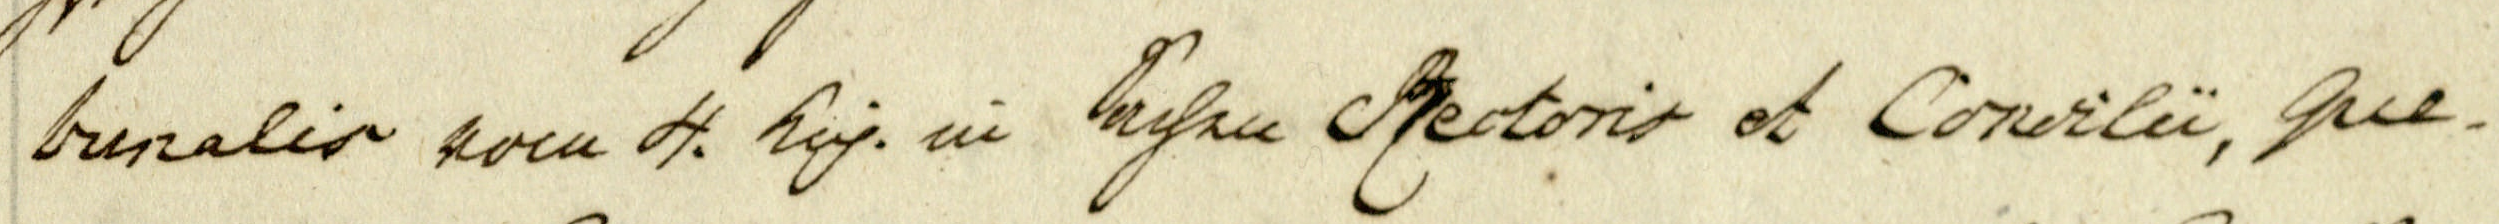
bunalis vom 4. huj. in Sachen Rectoris et Concilii, Que¬
